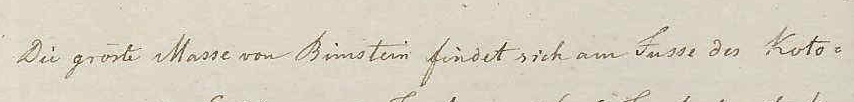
Die gröste Masse von Bimstein findet sich am Fusse des Koto-
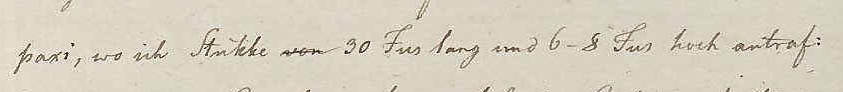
paxi, wo ich Stükke von 30 Fus lang und 6–8 Fus hoch antraf:
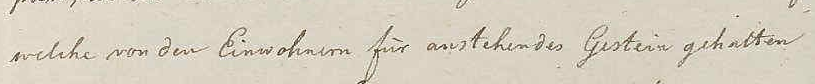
welche von den Einwohnern für anstehendes Gestein gehalten
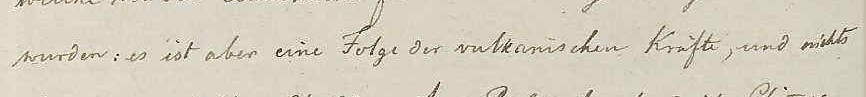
wurden: es ist aber eine Folge der vulkanischen Kräfte, und nichts
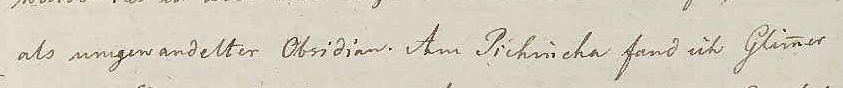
als umgewandelter Obsidian. Am Pichincha fand ich Glim̃er
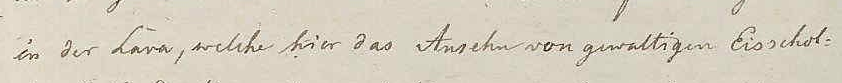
in der Lava, welche hier das Ansehn von gewaltigen Eisschol-
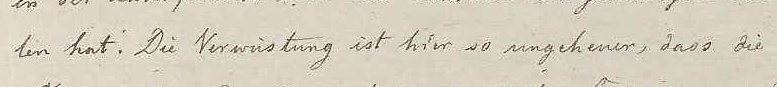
len hat. Die Verwüstung ist hier so ungeheuer, dass die
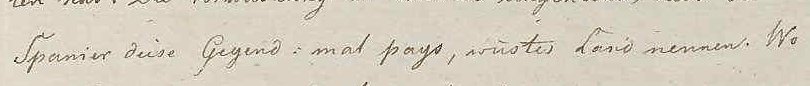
Spanier diese Gegend: mal pays, wüstes Land nennen. Wo
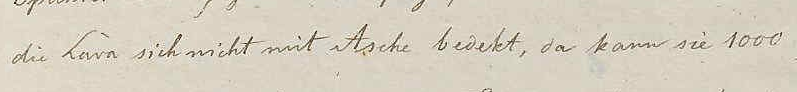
die Lava sich nicht mit Asche bedekt, da kann sie 1000
